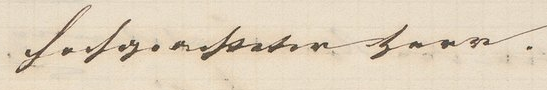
Hochgeachteter Herr.
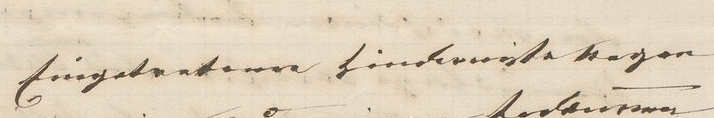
Eingetretener Hindernisse wegen
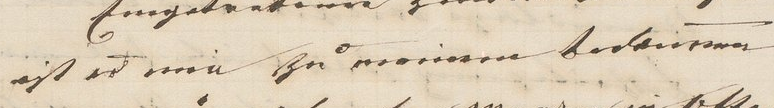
ist es mir zu meinem Bedauern
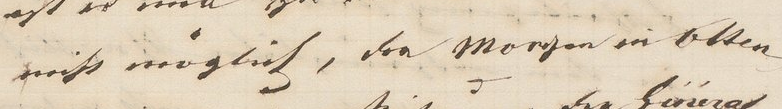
nicht möglich, der Morgen in Olten
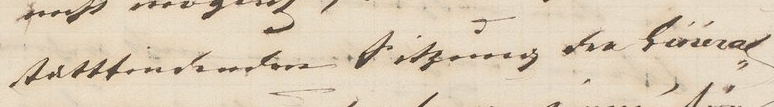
stattfindenden Sitzung der Général -
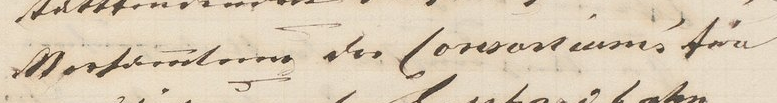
Versammlung des Consortium's für
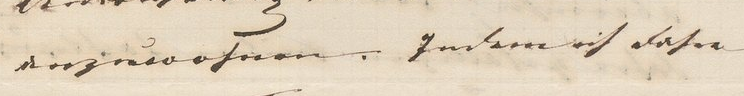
anzuwohnen. Indem ich daher
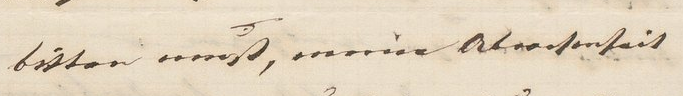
bitten muß, meine Abwesenheit
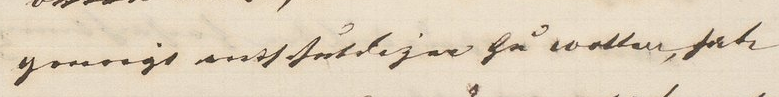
geneigt entschuldigen zu wollen, habe
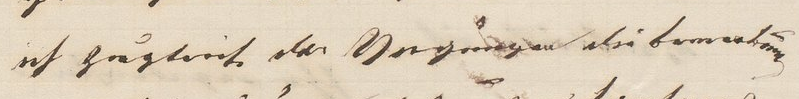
ich zugleich das Vergnügen die Bemerkung
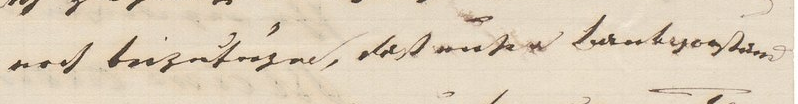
noch beizufügen, daß unser Bankvorstand
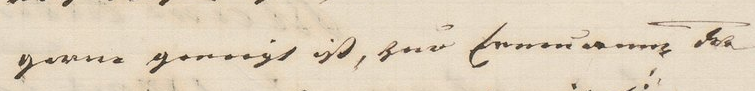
gerne geneigt ist, zur Erneuerung der
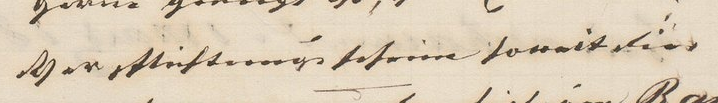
Verpflichtungsscheine soweit dies
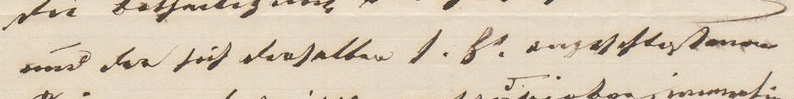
und der sich derselben s. Zt angeschloßenen
